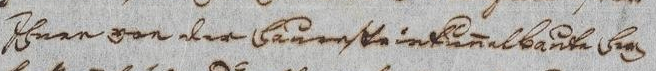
Ihnen von der Hauensteintunnelbaute her
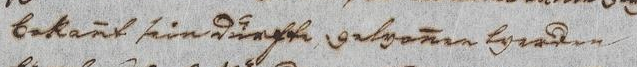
bekannt sein dürfte, gewonnen werden
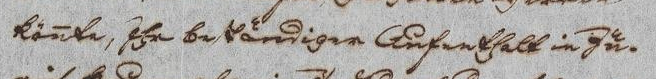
könnte, Ihr beständiger Aufenthalt in Zü-
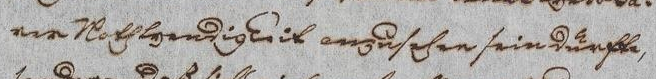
rer Nothwendigkeit anzusehen sein dürfte,
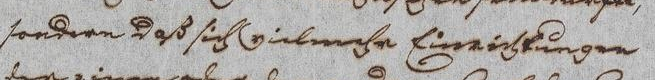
sondern daß sich vielmehr Einrichtungen
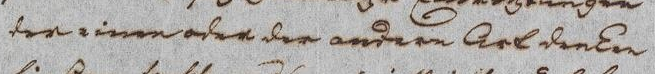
der einen oder der andern Art denken
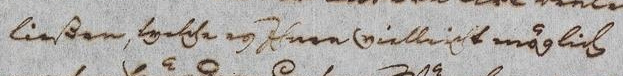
ließen, welche es Ihnen vielleicht möglich
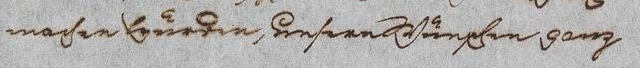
machen würden, unsern Wünschen ganz
